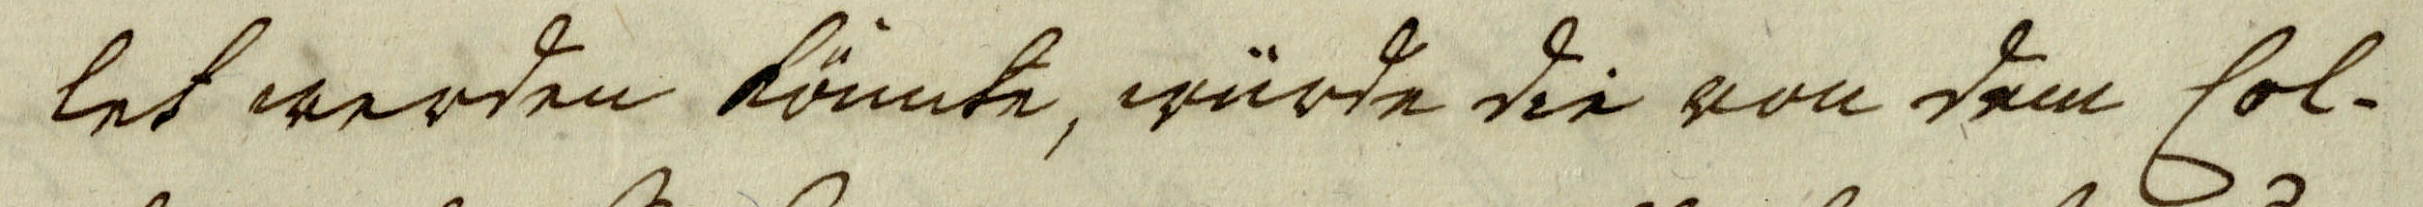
let werden könnte, würde die von dem Col¬
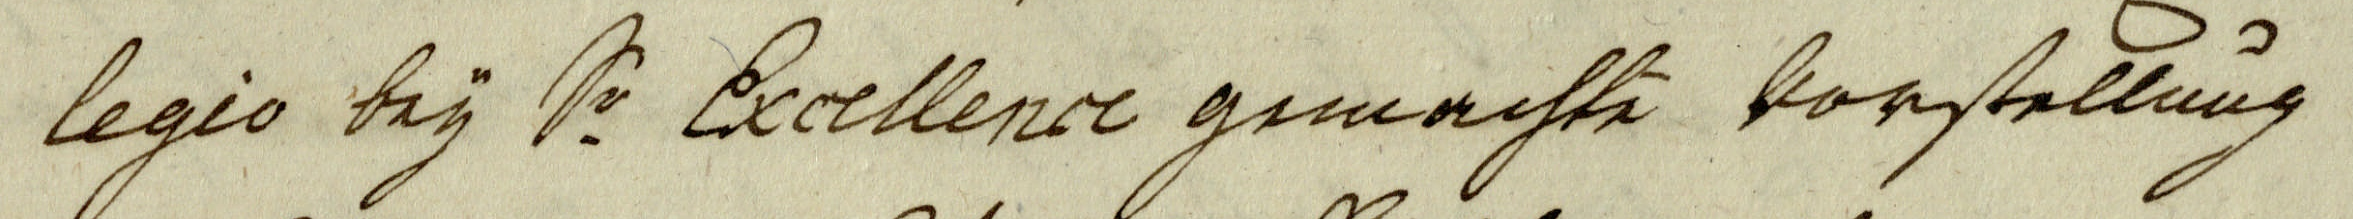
legio beÿ Sr. Excellence gemachte Vorstellung
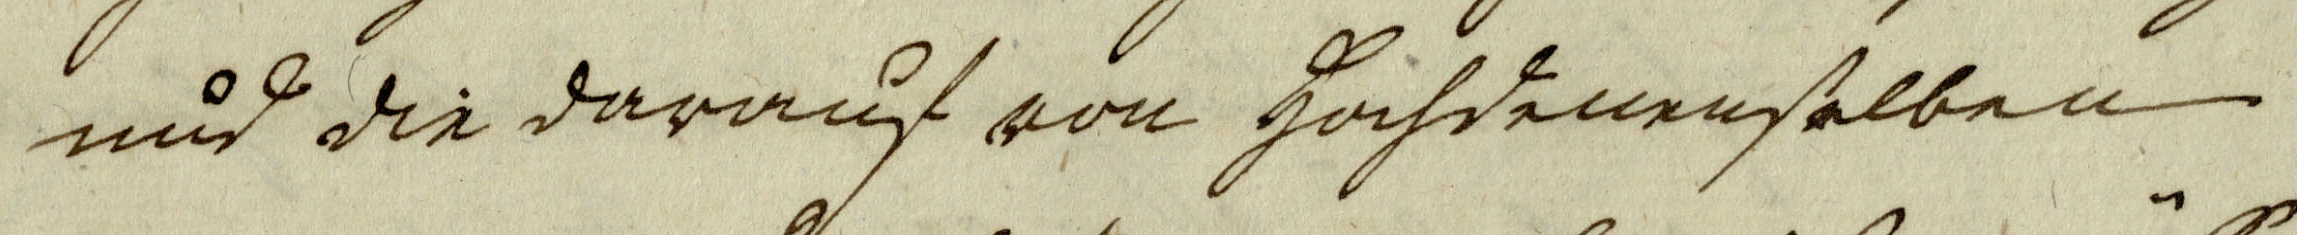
und die darauf von Hochdenenselben
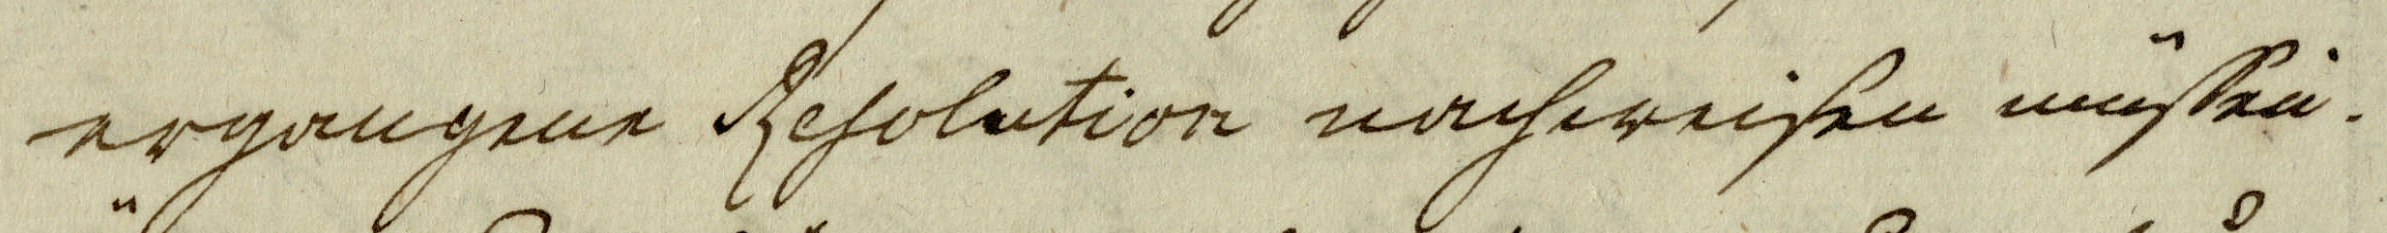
ergangene Resolution nachweisen müssen.
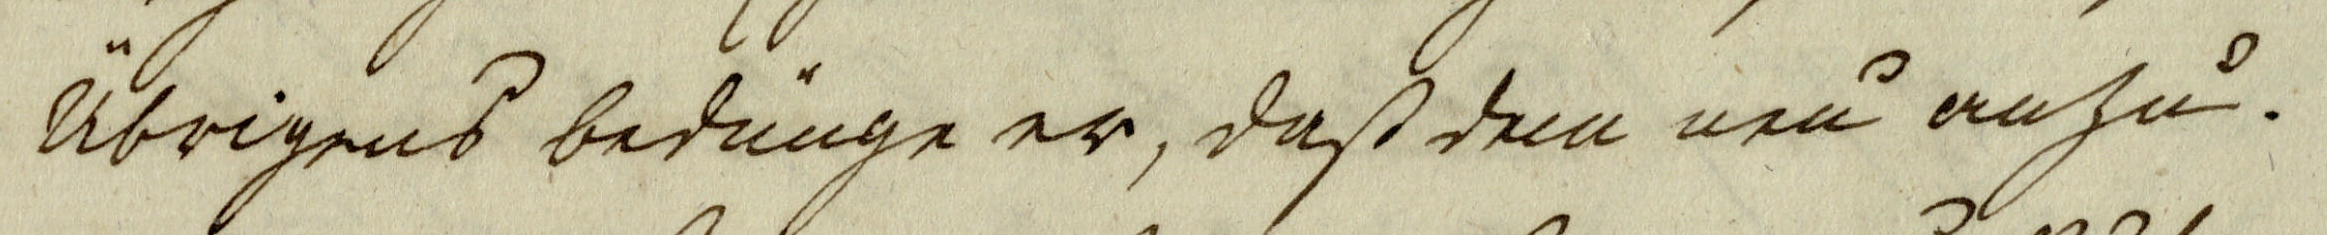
Übrigens bedünge er, daß dem neu anzu¬
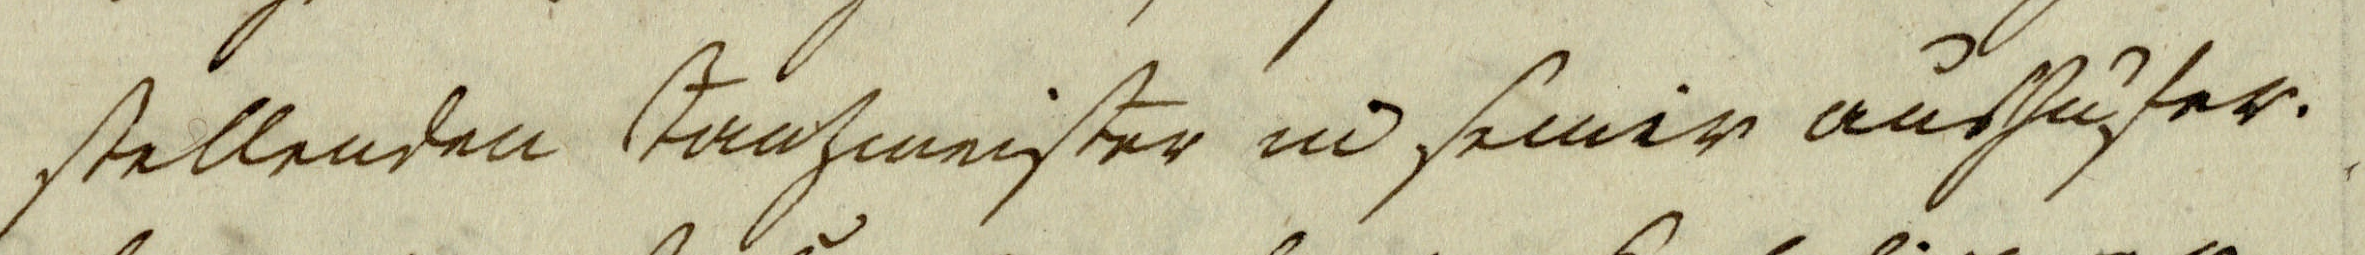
stellenden Tanzmeister in seiner auszufer¬
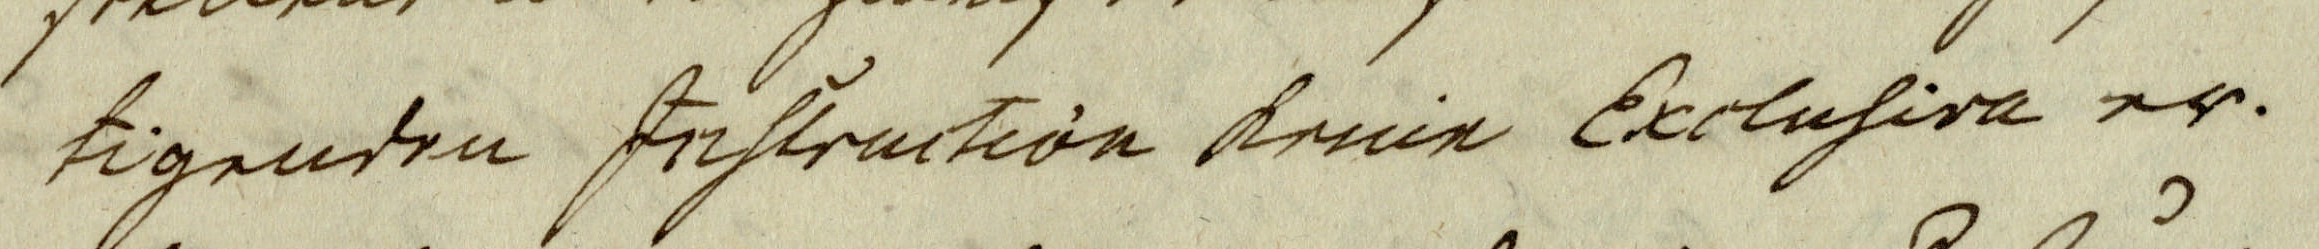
tigenden Instruction keine Exclusiva er¬
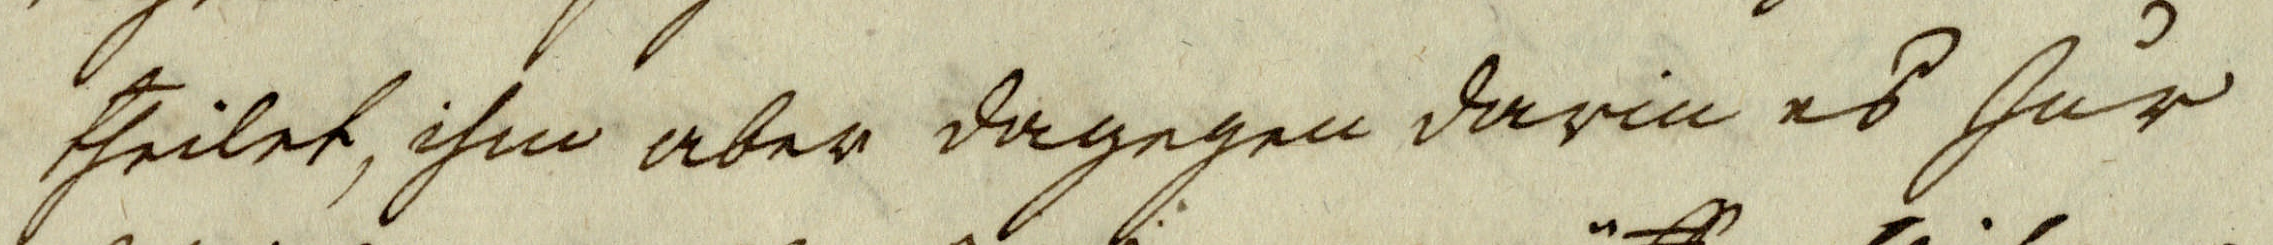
theilet, ihm aber dagegen darin es zur
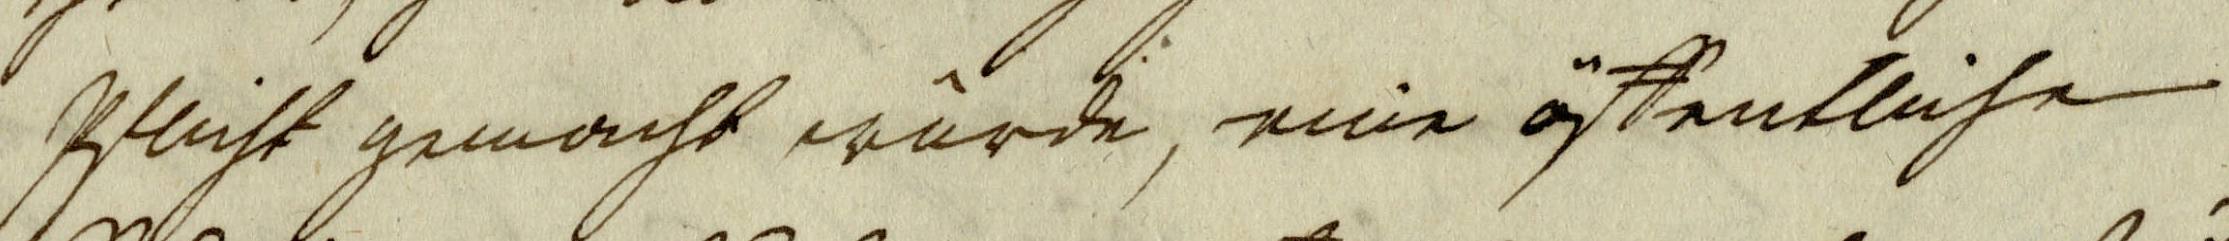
Pflicht gemacht würde, eine öffentliche
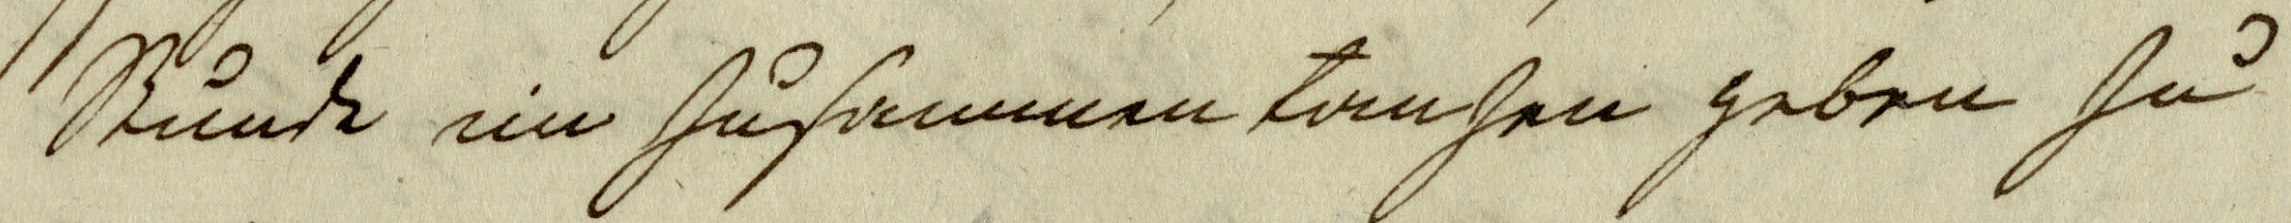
Stunde im Zusammentanzen geben zu
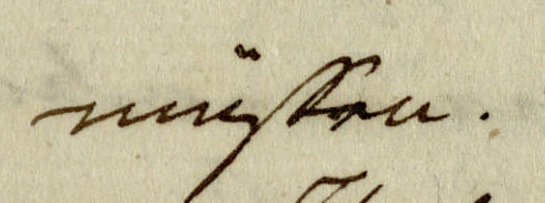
müssen.
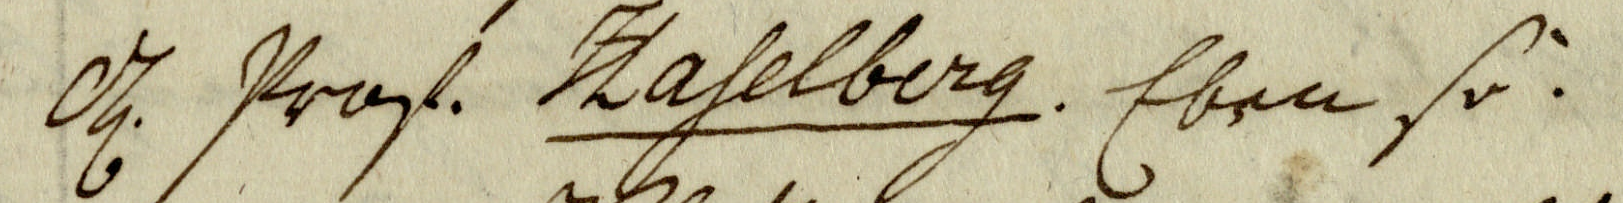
dh. Prof. Haselberg. Eben so.
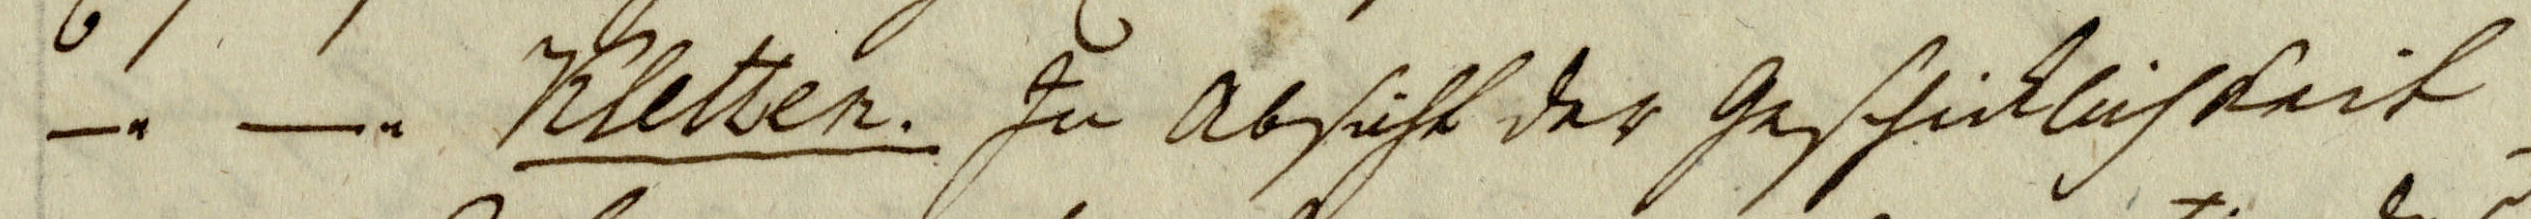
— " — " Kletten. In Absicht der Geschicklichkeit
